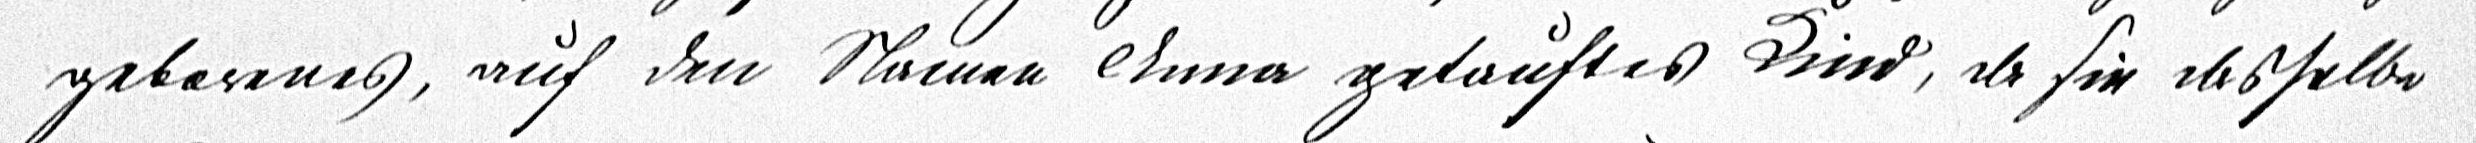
geborenes, auf den Namen Anna getauftes Kind, da sie dasselbe
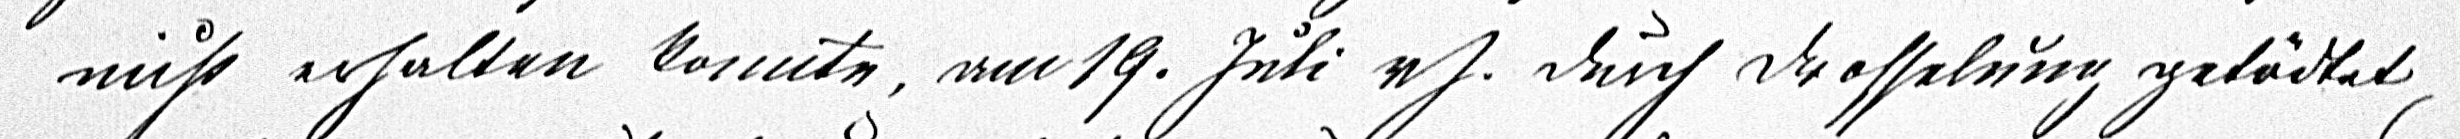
nicht erhalten konnte, am 19. Juli r J. durch Drosselung getödtet
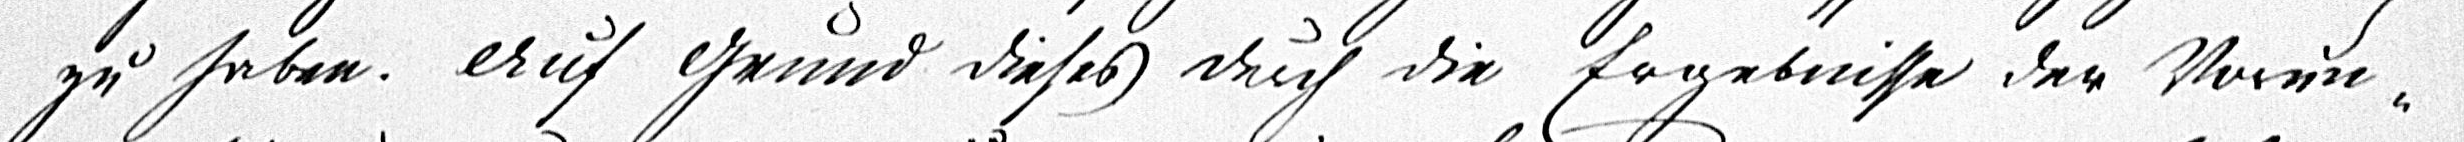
zu haben. Auf Grund dieses durch die Ergebnisse der Vorun¬
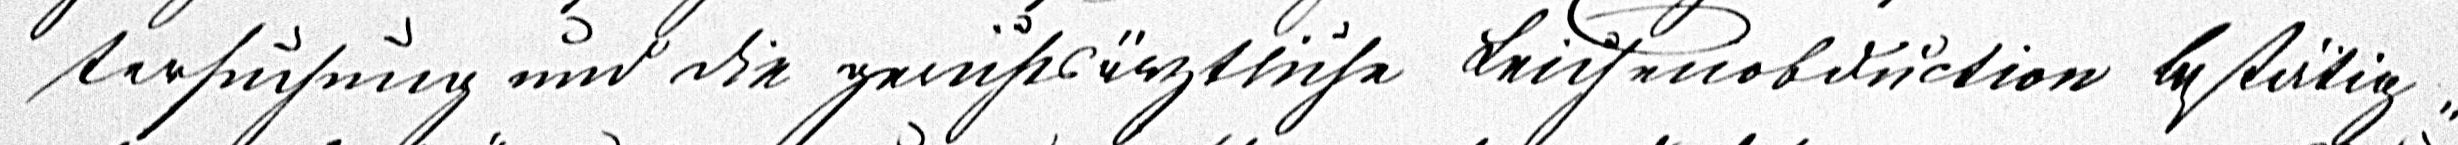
tersuchung und die gerichtsärztliche Leichenobduction bestätig¬
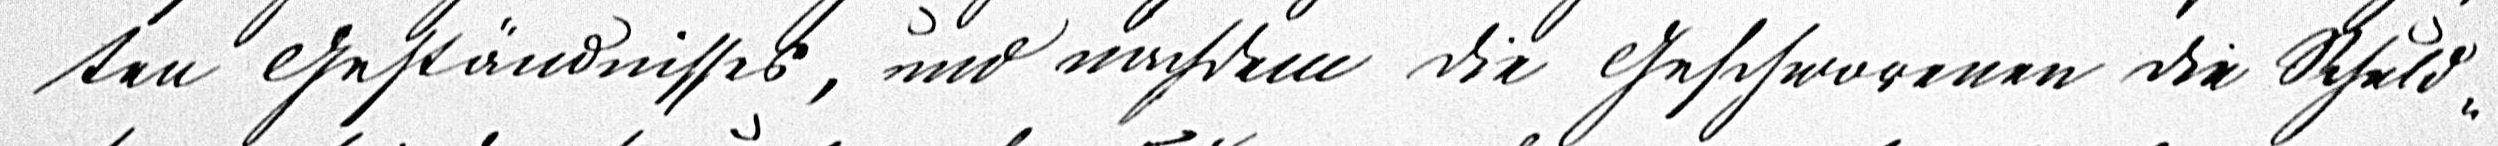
ten Geständnisses, und nachdem die Geschworenen die Schuld¬
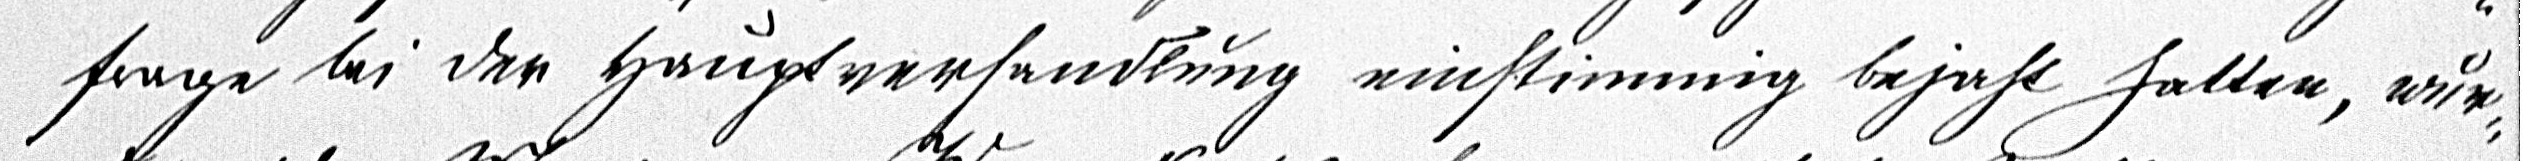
frage bei der Hauptverhandlung einstimmig bejaht halten, wur¬
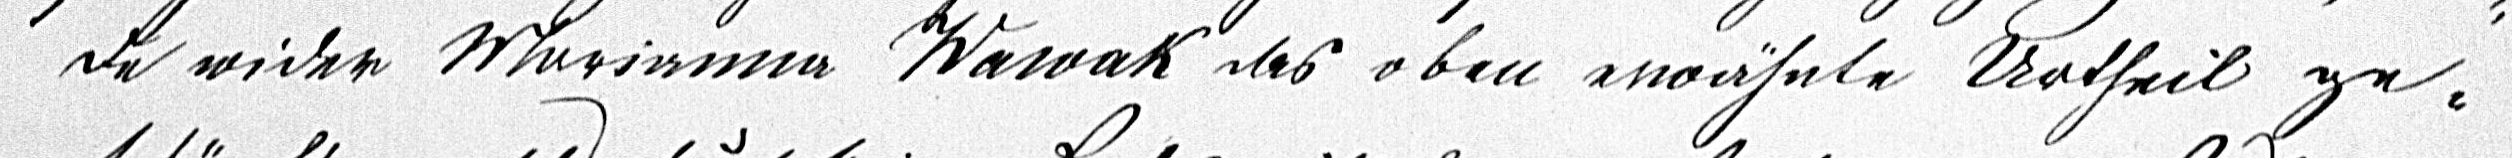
de wider Marianna Wawak das oben erwähnte Urtheil ge¬
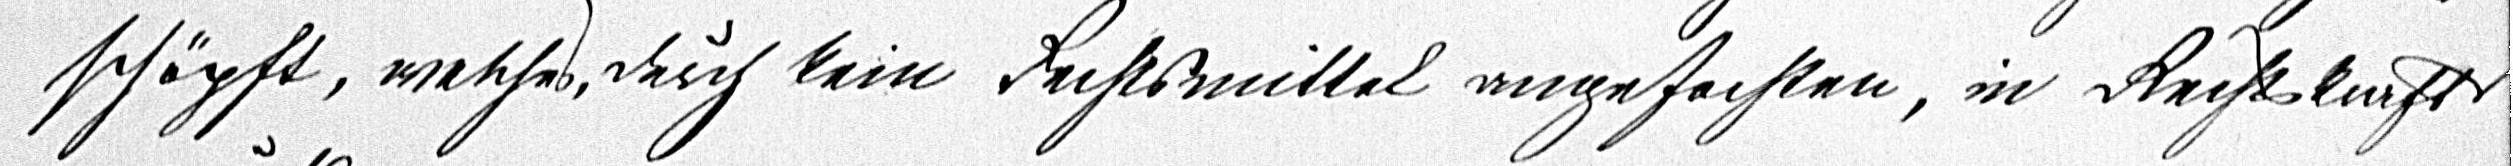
schöpft, welches, durch kein Rechtsmittel angefochten, in Rechtkraft
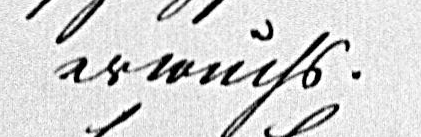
erwuchs.
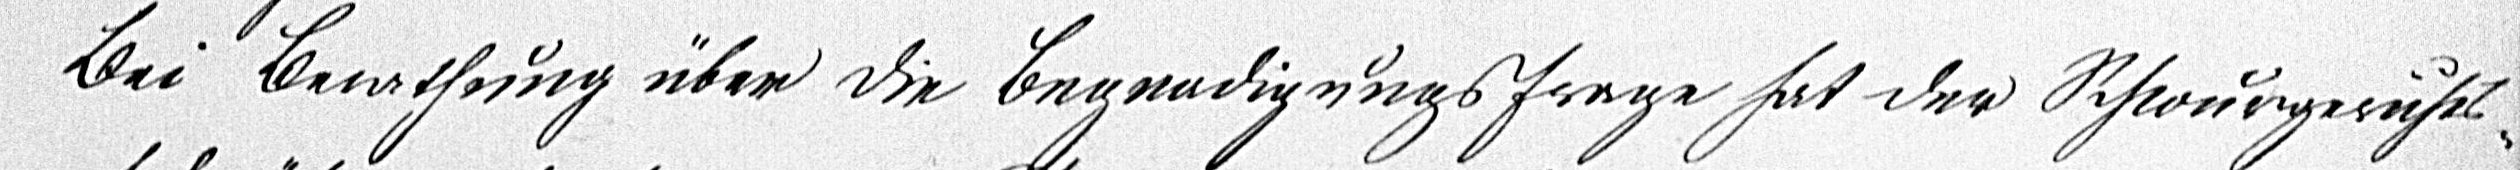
Bei Berathung über die Begnadigungsfrage hat der Schwurgerichts
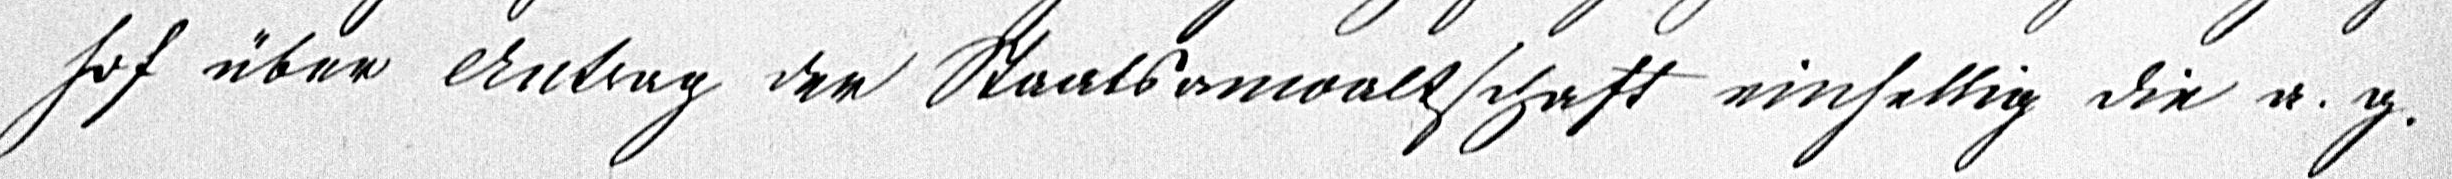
hof über Antrag der Staatsanwaltschaft einhellig die a. g.
